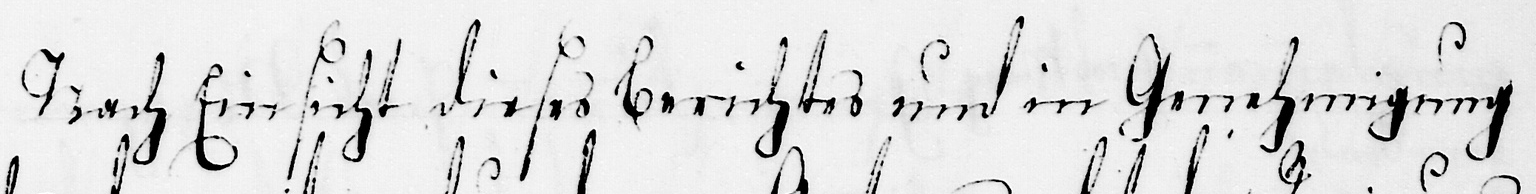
Nach Einsicht dieses Berichtes und in Genehmigung
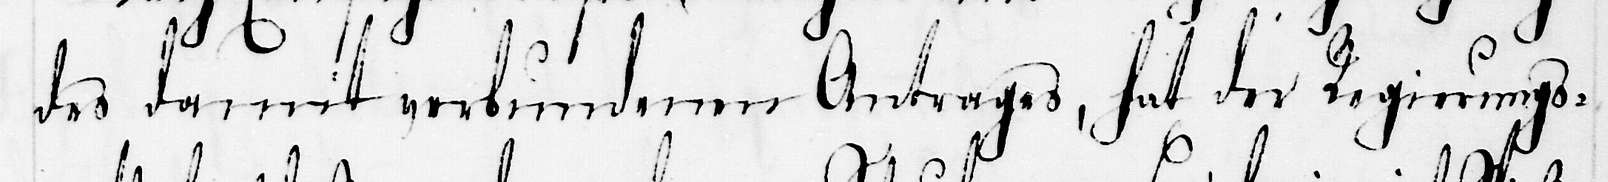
des damit verbundenen Antrages, hat der Regierungs¬
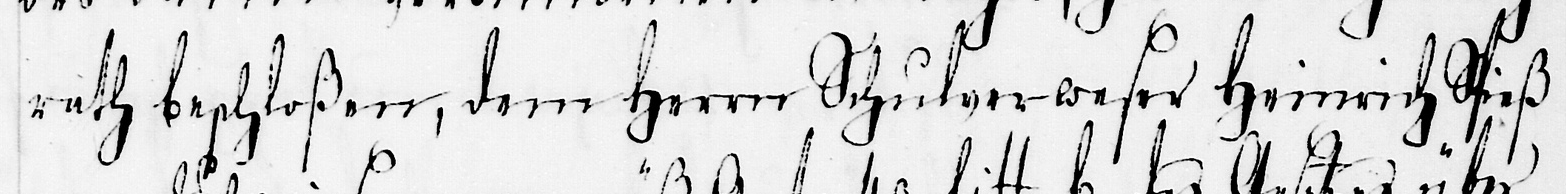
rath beschloßen, dem Herrn Schulverweser Heinrich Spieß
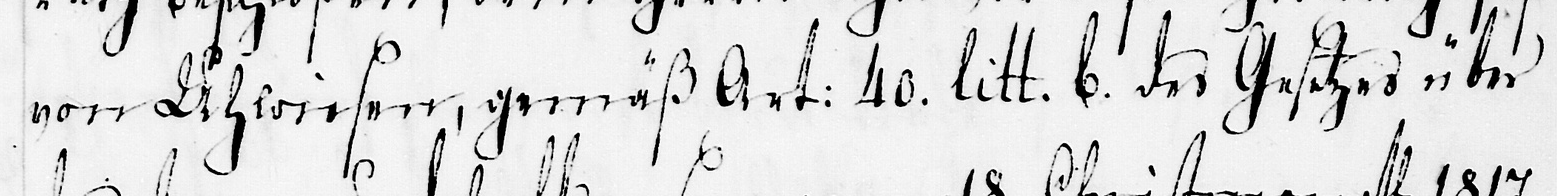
von Uhwiesen, gemäß Art: 40. litt. b. des Gesetzes über
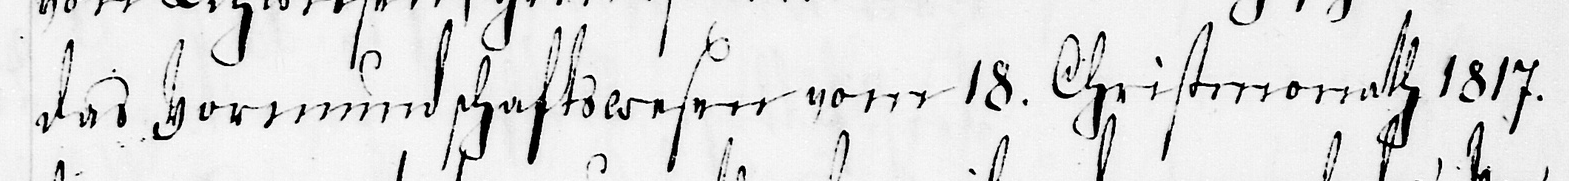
das Vormundschaftswesen vom 18. Christmonath 1817.
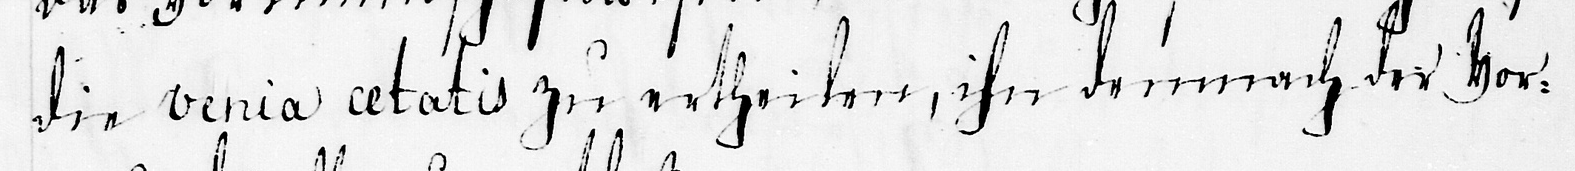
die venia cetatis zu ertheilen, ihn demnach der Vor¬
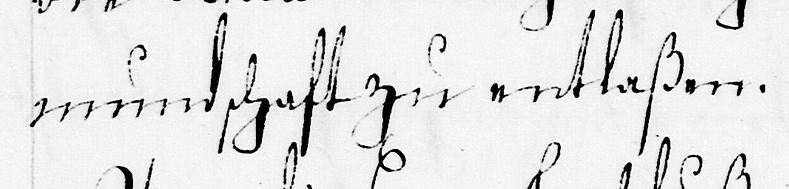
mundschaft zu entlaßen.
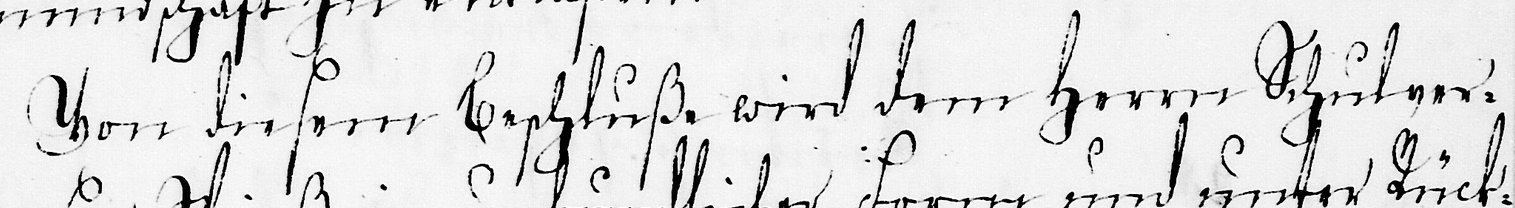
Von diesem Beschluße wird dem Herrn Schulver¬
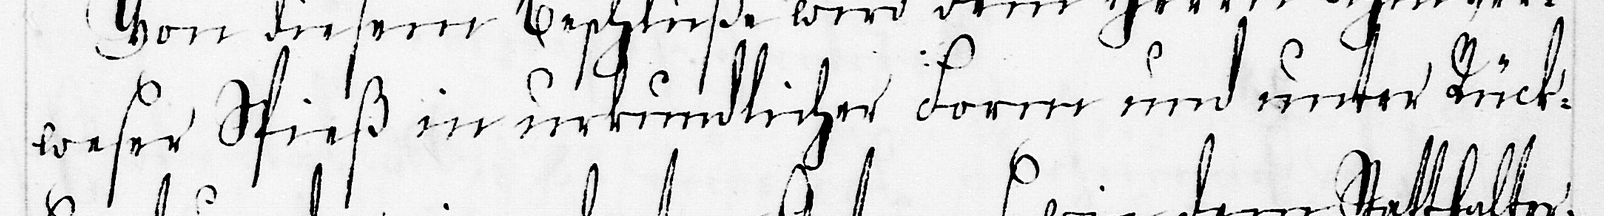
weser Spieß in urkundlicher Form und unter Rück¬
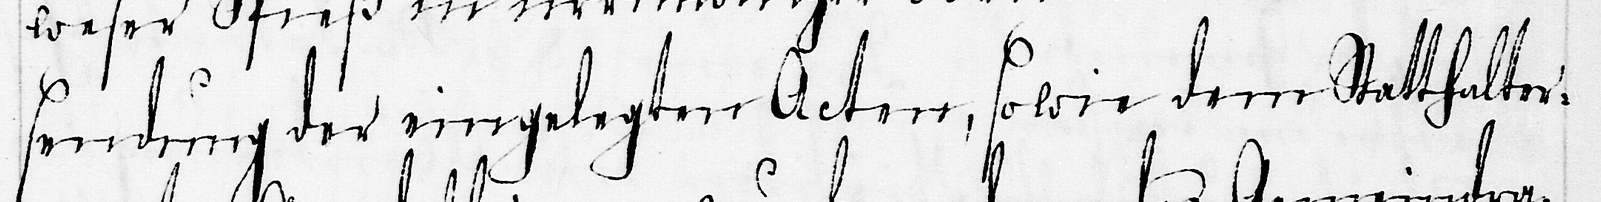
sendung der eingelegten Acten, sowie dem Statthalte¬
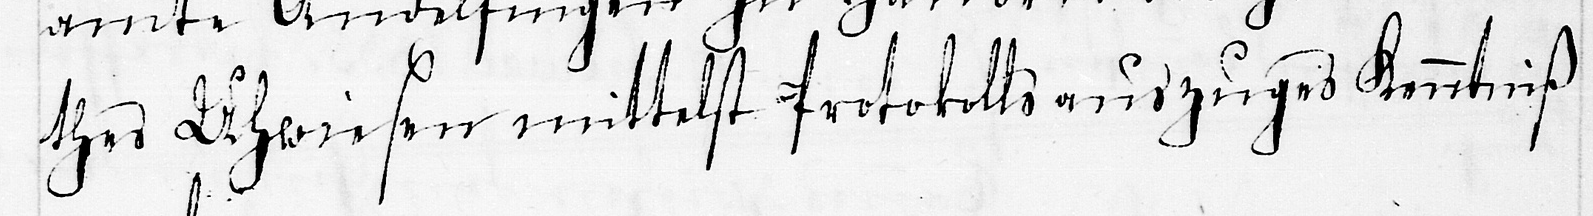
thes Uhwiesen mittelst Protokollsauszuges Kenntniß
